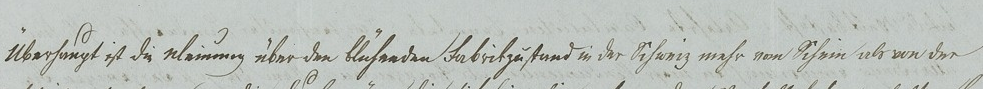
Überhaupt ist die Meinung über den blühenden Fabrikzustand in der Schweiz mehr vom Schein als von der
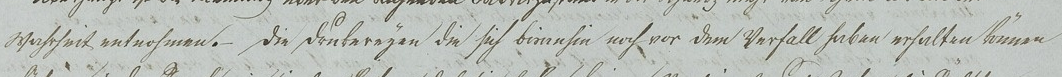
Wahrheit entnohmen. – Die Drukereyen die sich bisanhin noch vor dem Verfall haben erhalten können
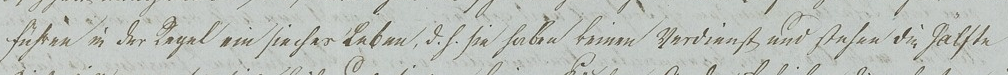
führen in der Regel ein sieches Leben, d. h. sie haben keinen Verdienst und stehen die Hälfte
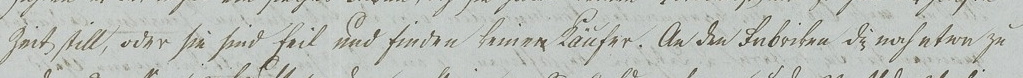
Zeit still, oder sie sind feil und finden keinen Käufer. An den Fabriken die noch etwa zu
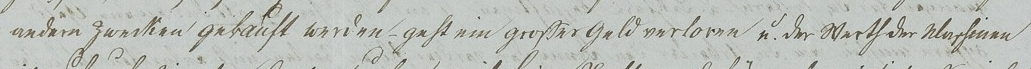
andern Zwecken gekauft werden – geht ein großes Geld verloren u. der Werth der Maschinen
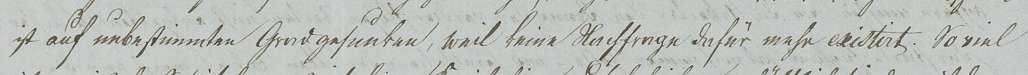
ist auf unbestimmten Grad gesunken, weil keine Nachfrage dafür mehr existirt. Soviel
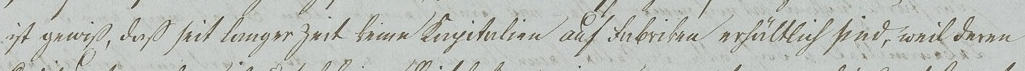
ist gewiß, daß seit langer Zeit keine Kapitalien auf Fabriken erhältlich sind, weil deren
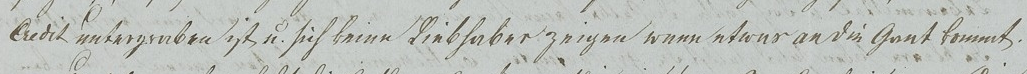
Credit untergraben ist u. sich keine Liebhaber zeigen wenn etwas an die Gant kommt.
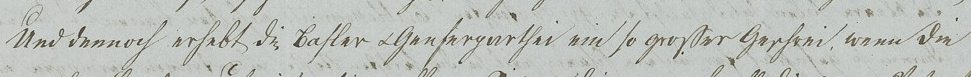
Und dennoch erhebt die Basler & Genferparthei ein so großes Geschrei, wenn die
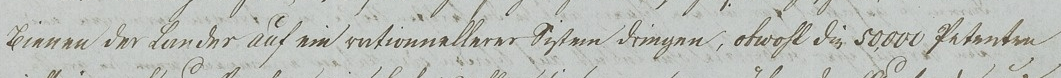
Bienen des Landes auf ein rationnelleres Sistem dringen, obwohl die 50,000 Petenten
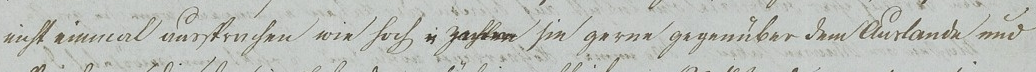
nicht einmal aussprachen wie hoch in Zahlen sie gerne gegenüber dem Auslande und
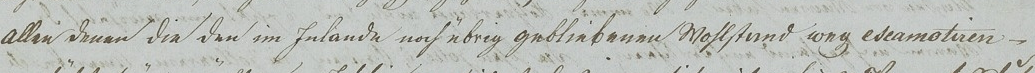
Allen denen die den im Inlande noch übrig gebliebenen Wohlstand weg escamotiren –
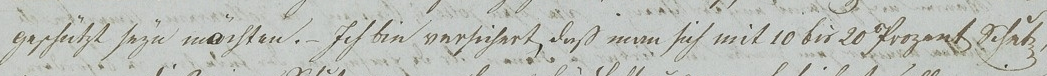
geschützt seyn möchten. – Ich bin versichert, daß man sich mit 10 bis 20 Prozent Schutz,
